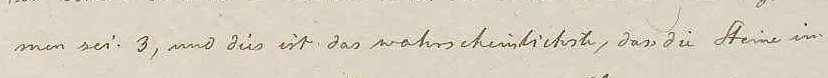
men sei. 3, und dies ist das wahrscheinlichste, dass die Steine im
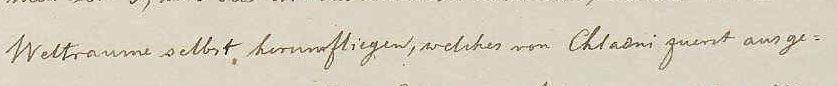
Weltraume selbst herumfliegen, welches von Chladni zuerst ausge-
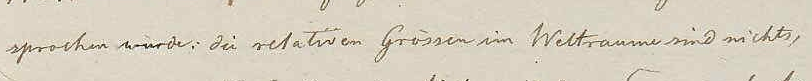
sprochen wurde: die relativen Grössen im Weltraume sind nichts,
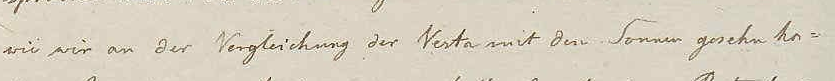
wie wir an der Vergleichung der Vesta mit den Sonnen gesehn ha-
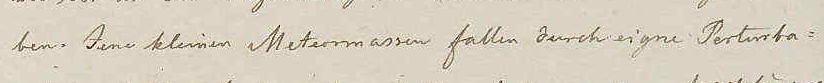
ben. Jene kleinen Meteormassen fallen durch eigne Perturba-
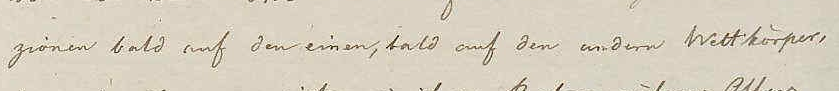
zionen bald auf den einen, bald auf den andern Weltkörper,
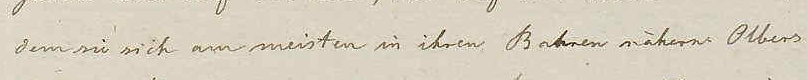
dem sie sich am meisten in ihren Bahnen nähern. Olbers
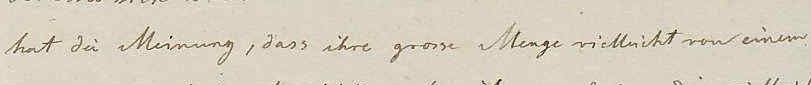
hat die Meinung, dass ihre grosse Menge vielleicht von einem
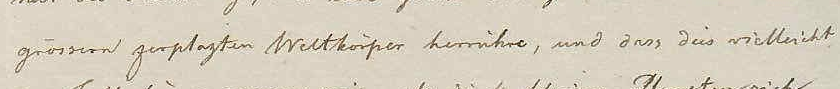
grössern zerplazten Weltkörper herrühre, und dass dies vielleicht
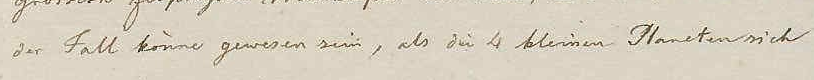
der Fall könne gewesen sein, als die 4 kleinen Planeten sich
